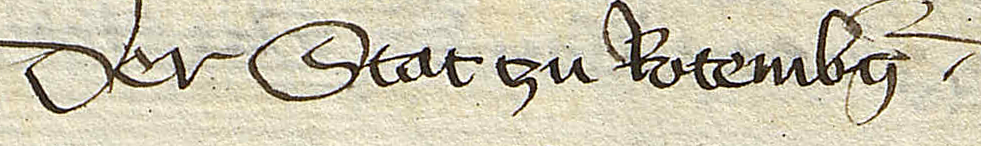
Der Stat cʒu Rotemb*g
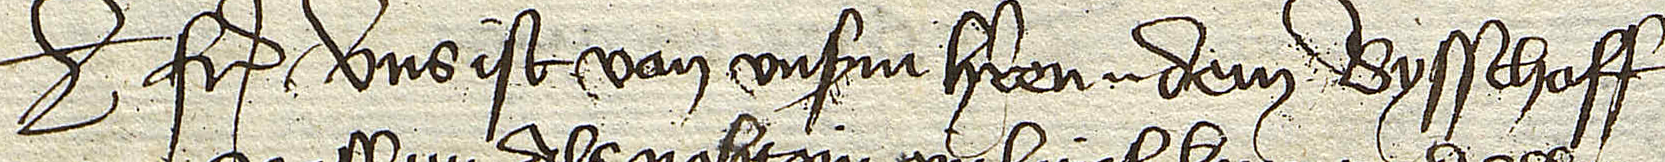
L* fr* / Vns iſt von vnſ*m h*ren ~ dem Byſſchoff
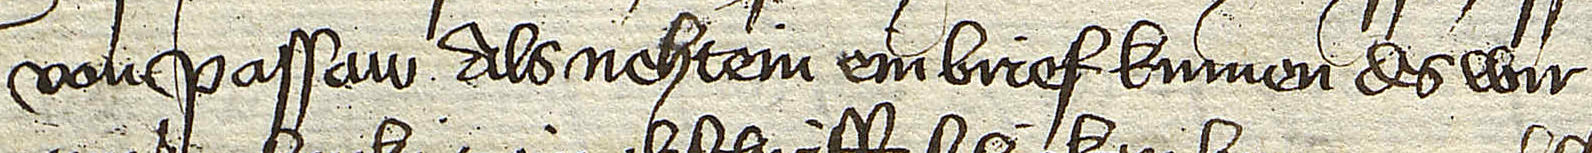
von Paſſaw Als nehſtein ein brief kumen des wir
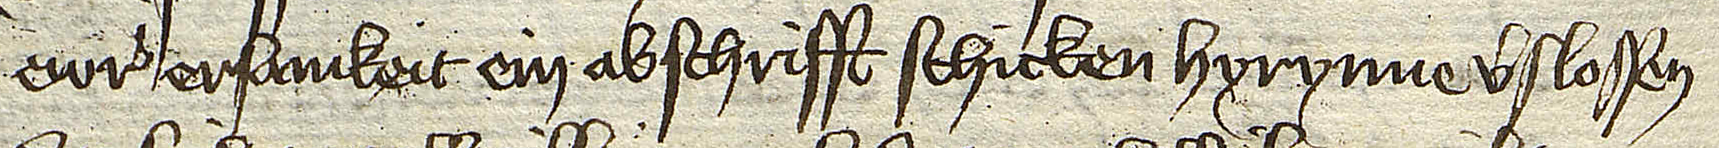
ewr* erſamkeit ein abſchrifft ſchicken hyrynne v*ſloſſen
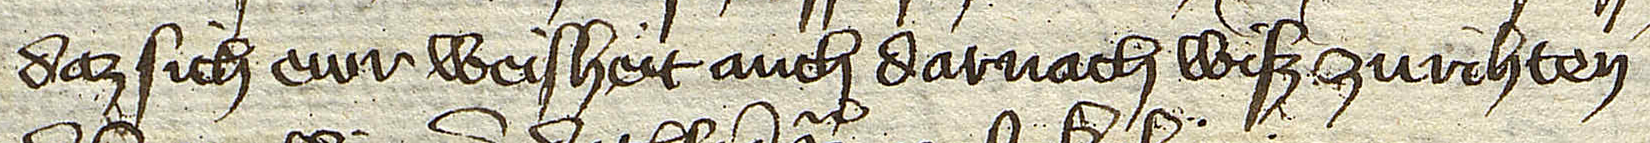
daʒ ſich ewr weiſheit auch darnach wiſʒ ʒu richten
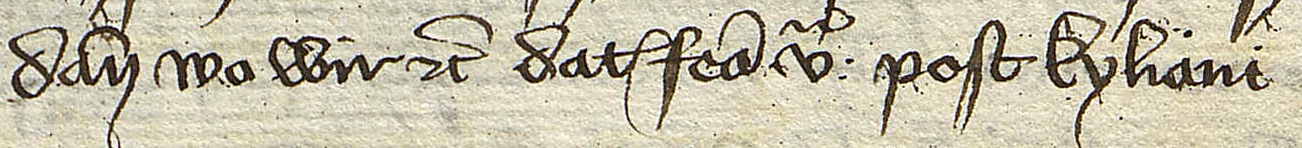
dan* wo wir ec* dat* fea* v* poſt kyliani
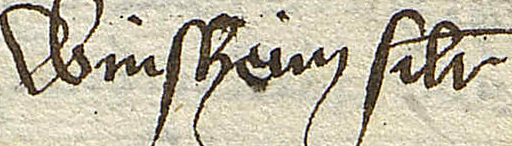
Winſheim ſilr*
